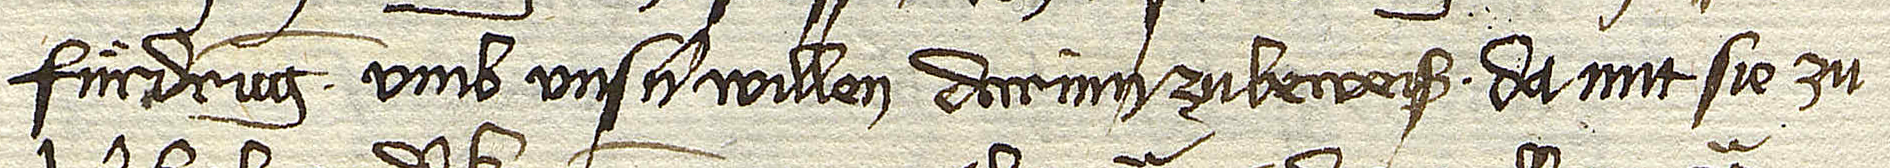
fürdrug* . vmb vnſn* willen darinn ʒubeweiſ* da mit ſie ʒu
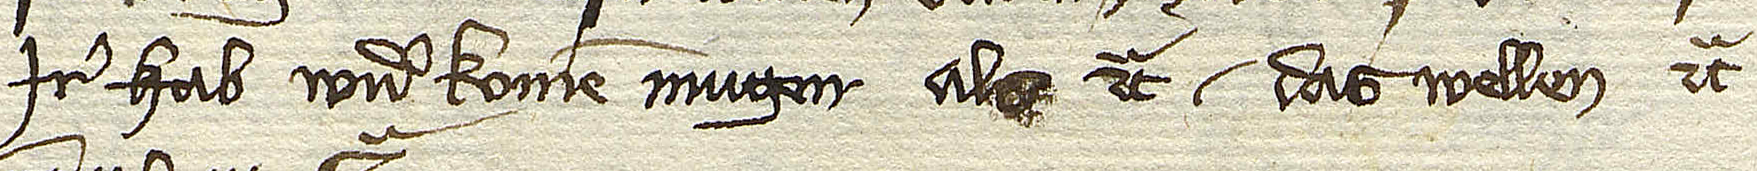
Ir* hab wid* kome* mugen . als ec* / das wellen ec*
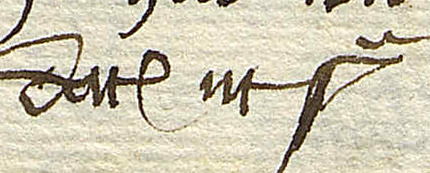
Dat* ut ſ*
